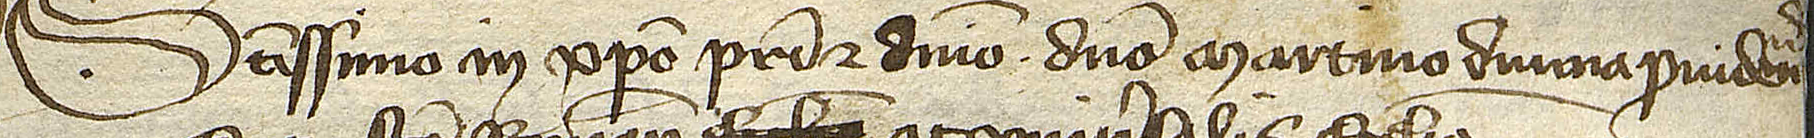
S*tiſſimo in xpo* p*ri @ d*nio . d*no Martino diuina p*uiden*
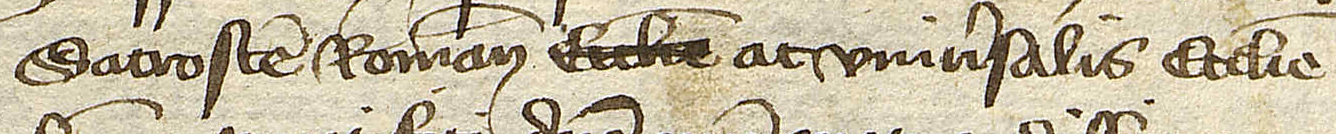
Sacros*te Roman* Ecclie* ac vniu*ſalis Eccle*ie
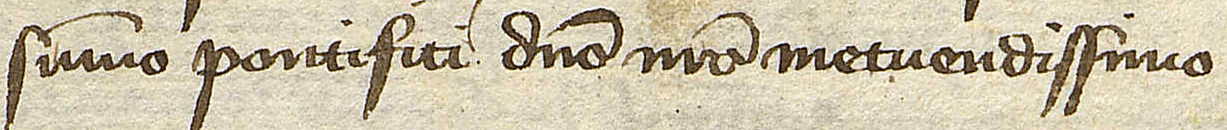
ſum*o ponitfici d*no n*ro metuendiſſimo
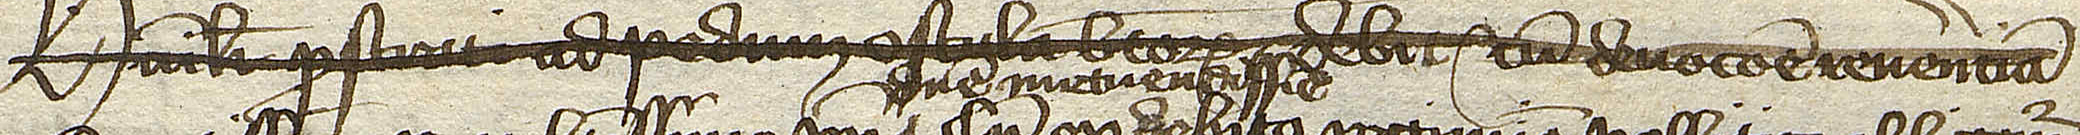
Huilr* p*ſ%%%% ad pedum %ſ%%%bto* /deb% cu* deuocoe* reuencia*
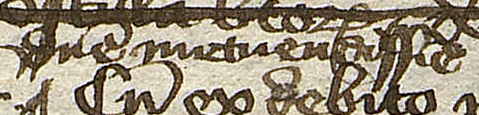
d*ne metuendiſſi*e
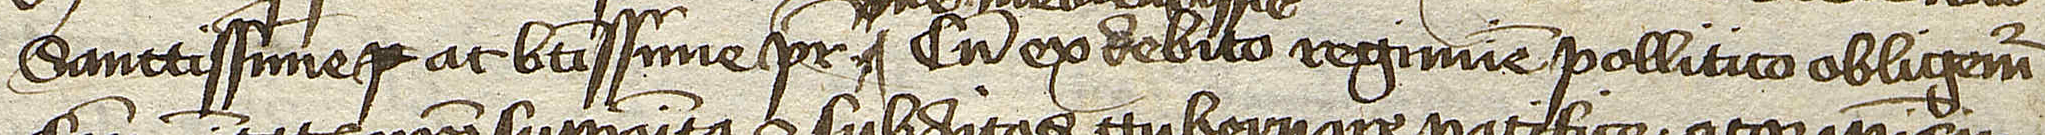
Sanctiſſime p ac b*tiſſime p*r . Cu* ex debito regimi*e pollitico obligem*
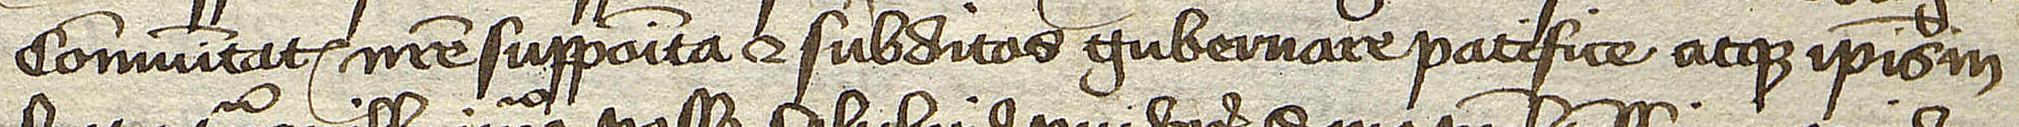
Com*u*itat* n*re ſuppo*ita @ ſubditos gubernare pacifice atq* ip*is in
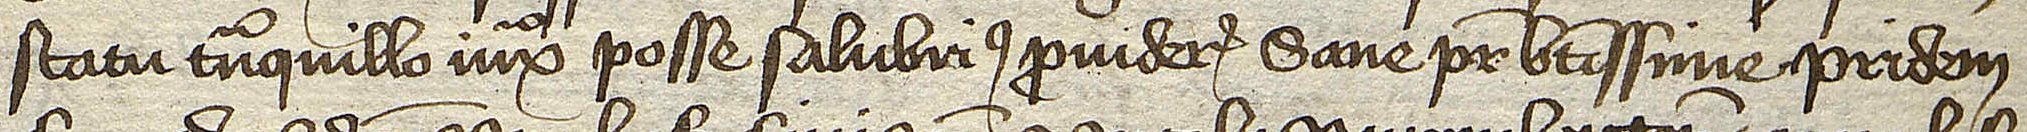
ſtatu t*nquillo iux* poſſe ſalubri* p*uider* Sane p*r b*iſſime Pridem
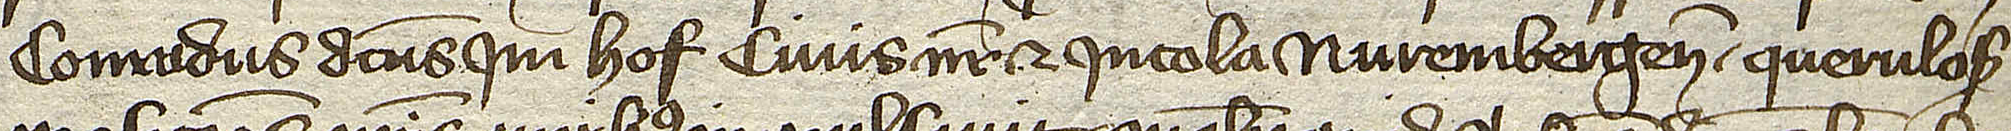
Conradus d*c*us Im hof Ciuis n*r @ Incola Nurembergen* / queruloſ*
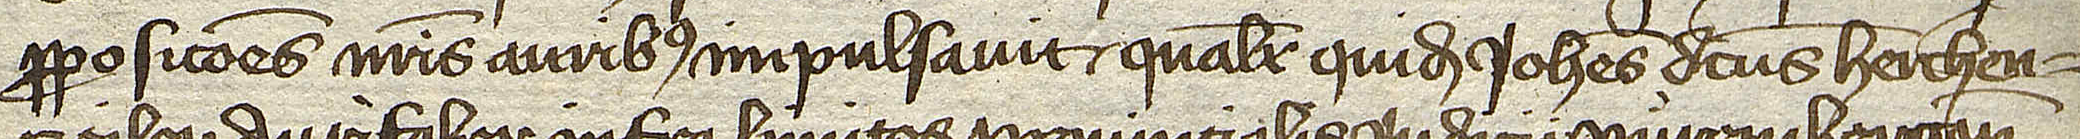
p*poſic*o*es n*ris aurib* impulſauit / qualr* quid* Ioh*es d*c*us Herchen=
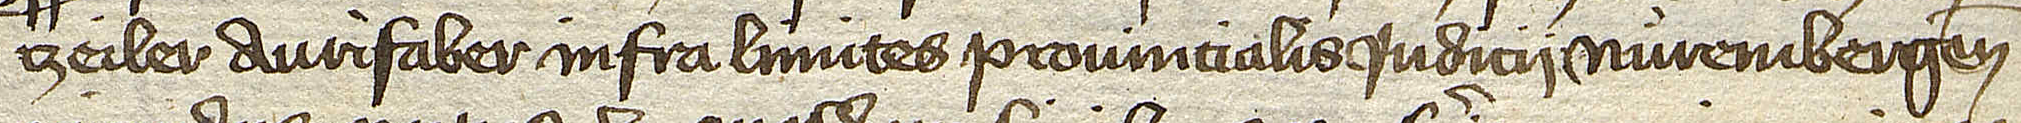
cʒeiler Aurifaber infra limites prouincialis Iudicii Nürembergen*
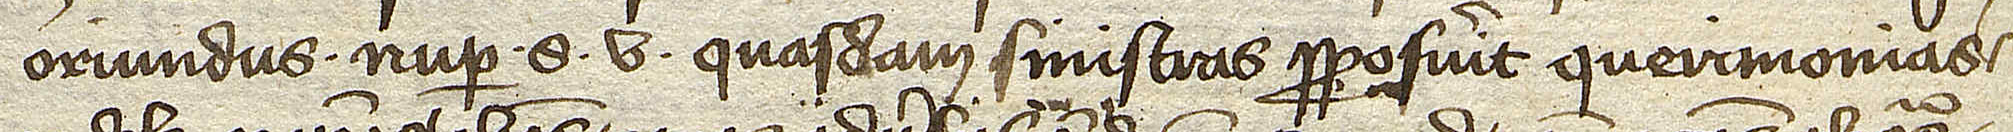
oriundus . nup* . S* . v* . quaſdam ſiniſtras p*poſu*it querimonias /
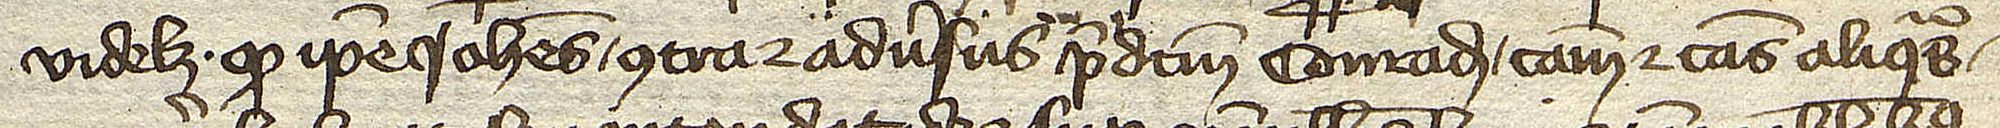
videl* q* ip*e Ioh*es / *tra @ adu*ſus p*d*c*m Conrad* / ca*m @ ca*s aliq* /
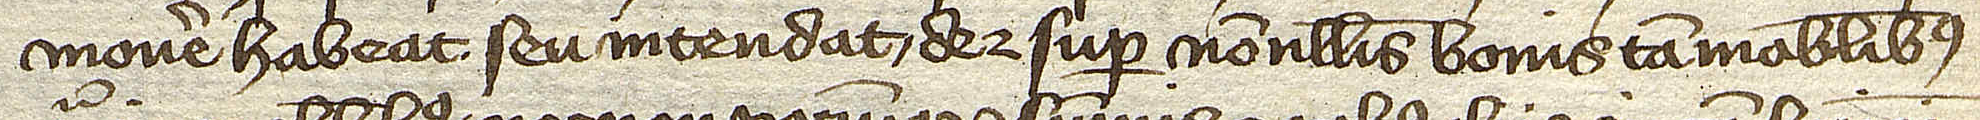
mone* habeat . ſeu intendat / de @ ſup* no*n*llis bonis ta* mob*lib*
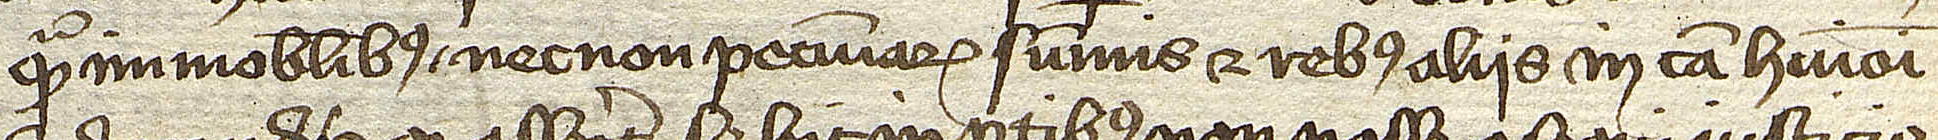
q* immob*lib* / necnon pecu*ia* ſu*mis @ reb* aliis in c*a hui*o*i
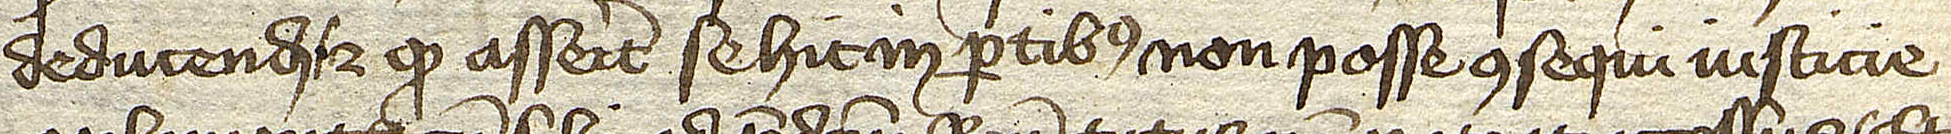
deducend* @ q* aſſe*it ſe hic p*tib* non poſſe *ſequi iuſticie
